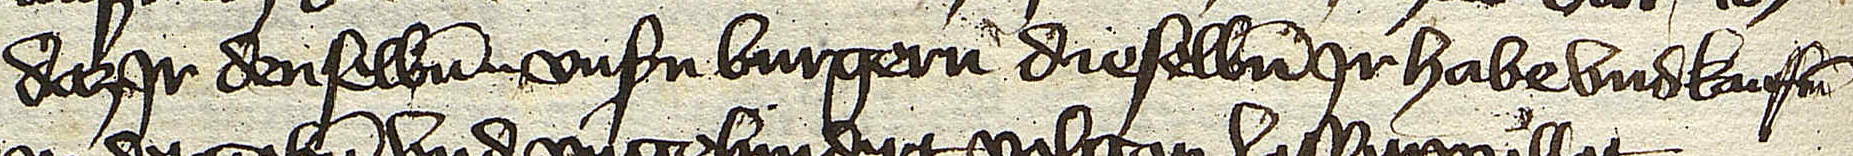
daʒ Ir denſelb*n ~ vnſ*n burgern dieſelb*n Ir habe vnd kauffm*
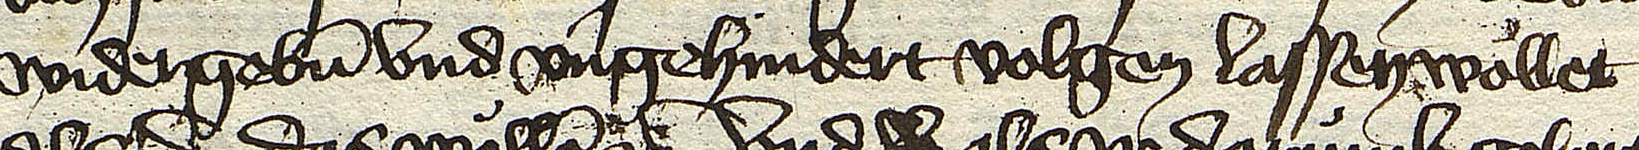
widergeb*n vnd vngehindert volgen laſſen wöllet
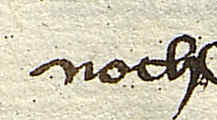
noch
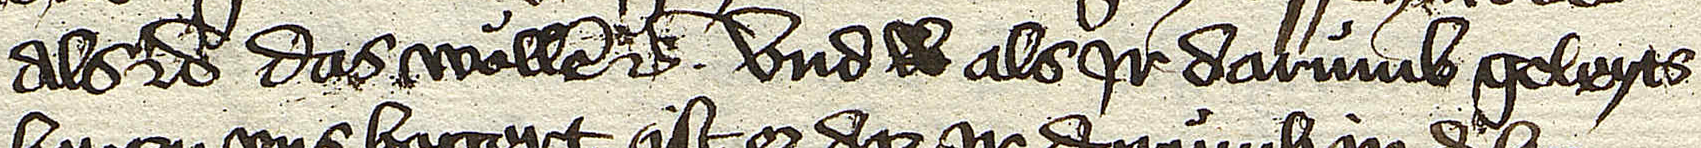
Als ec* das wölle* ec* . Vnd w als Ir darümb geleyts
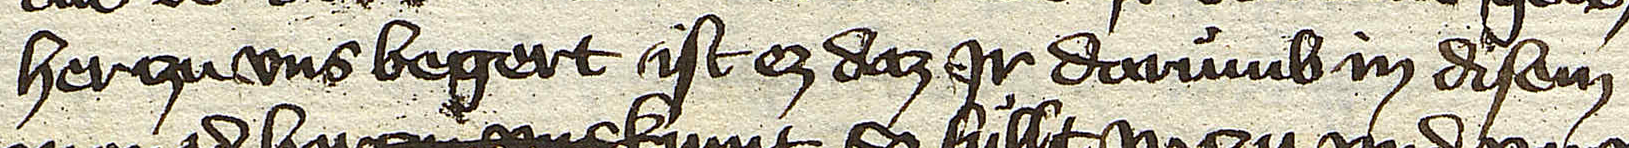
her cʒu vns begert / iſt eʒ daʒ Ir darümb in diſem
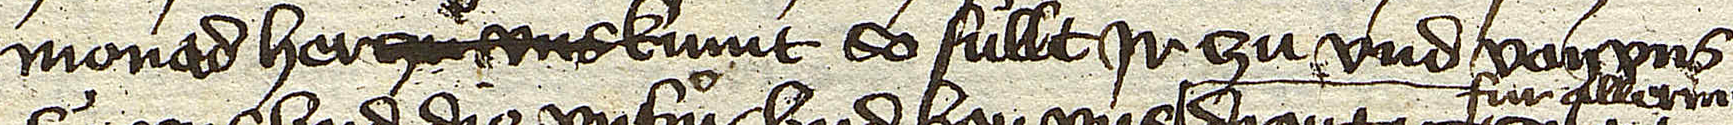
monad her cʒu vns kumt so ſüllt Ir cʒu vnd von vns
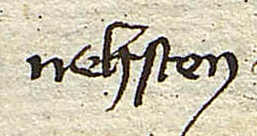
nehſten
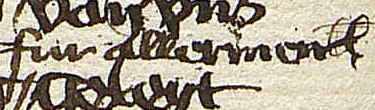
für allermenkl*
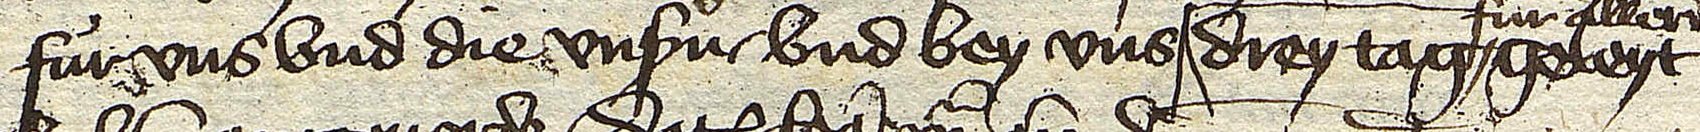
für vns vnd die vnſ*n / vnd bey vns drey tag geleyt
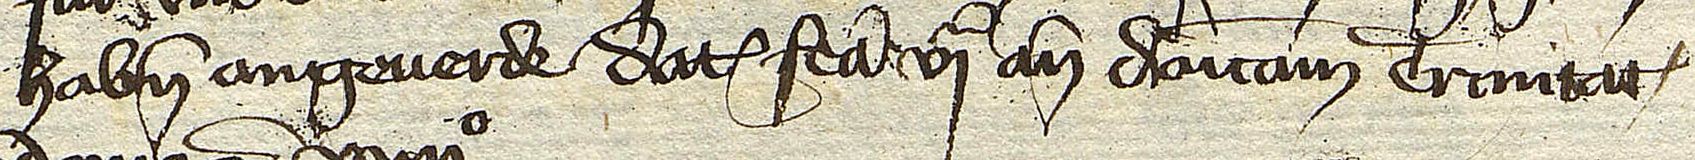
hab*n ongeuerde / Dat* fea* vi* an* doicam* Trinitat*
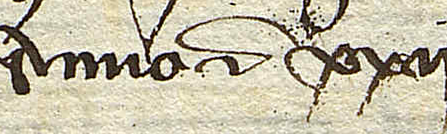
Anno ec* xxii*
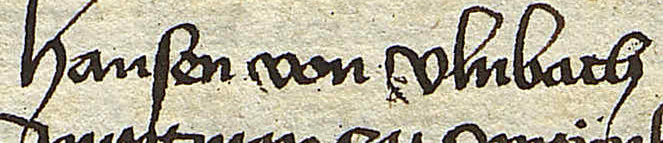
Hanſen von Vlnbach
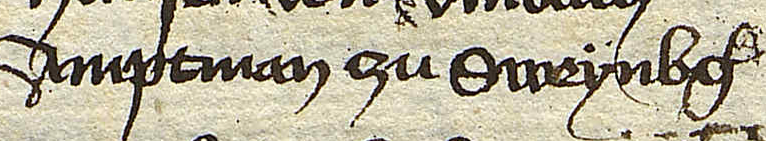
Amptman cʒu Sweynb*g
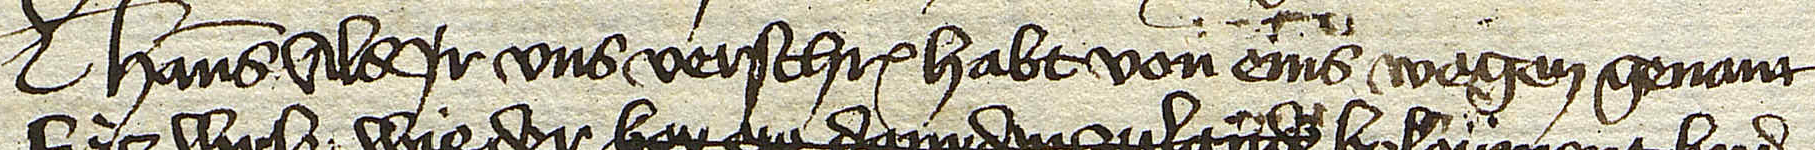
L* hans* Als Ir vns verſchr* habt von eins wegen genant
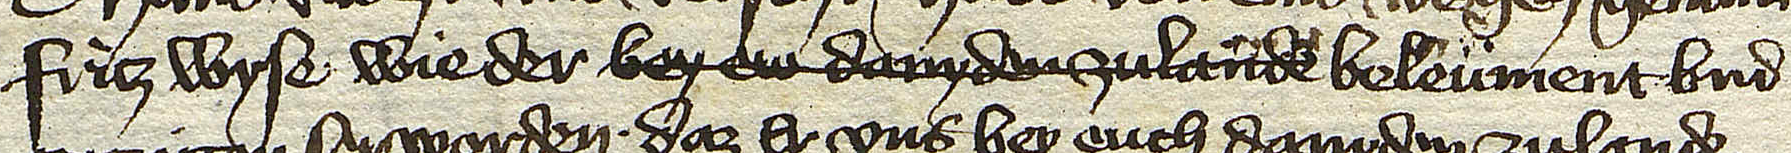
fricʒ Wyſe wie der bey ew danyden cʒu lande beküment vnd
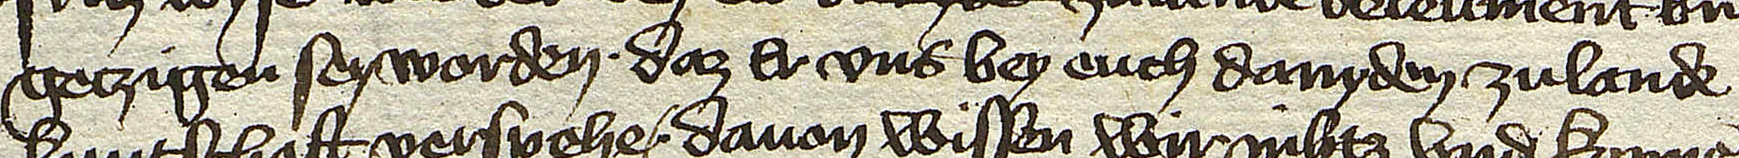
gecʒigen ſey worden . daʒ Er vns bey euch danyden cʒulande
